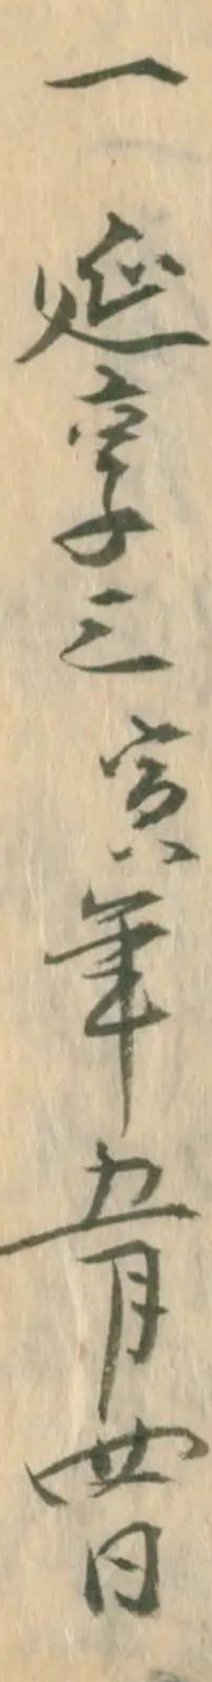一延享三寅年五月四日

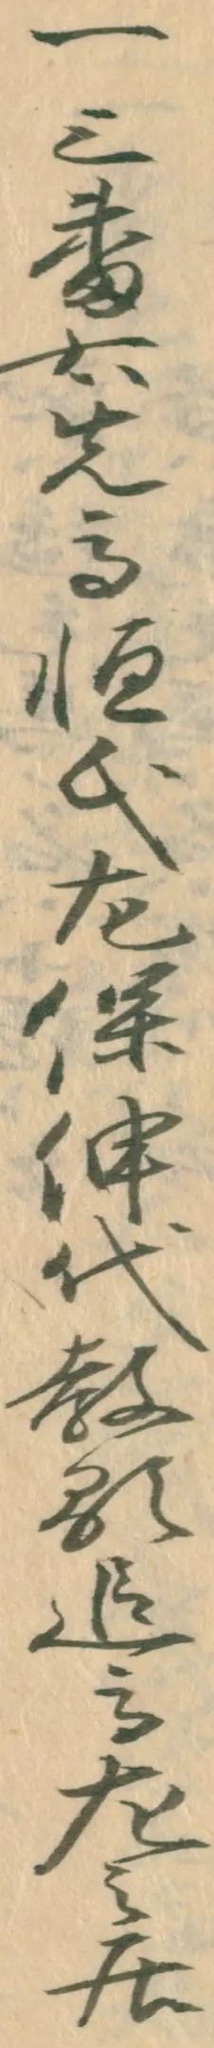一三番右先馬恒氏左保伸代教顕追而左之居
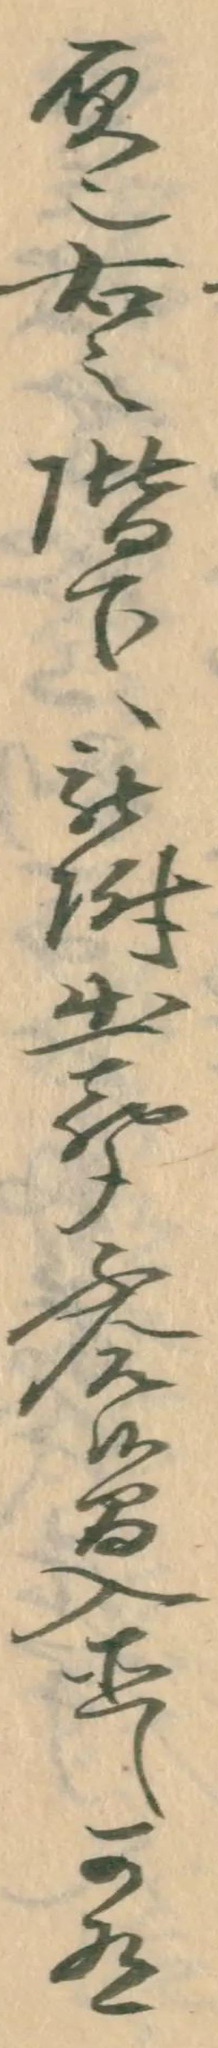負也右之階下へ被附出声不合候間入直し可有
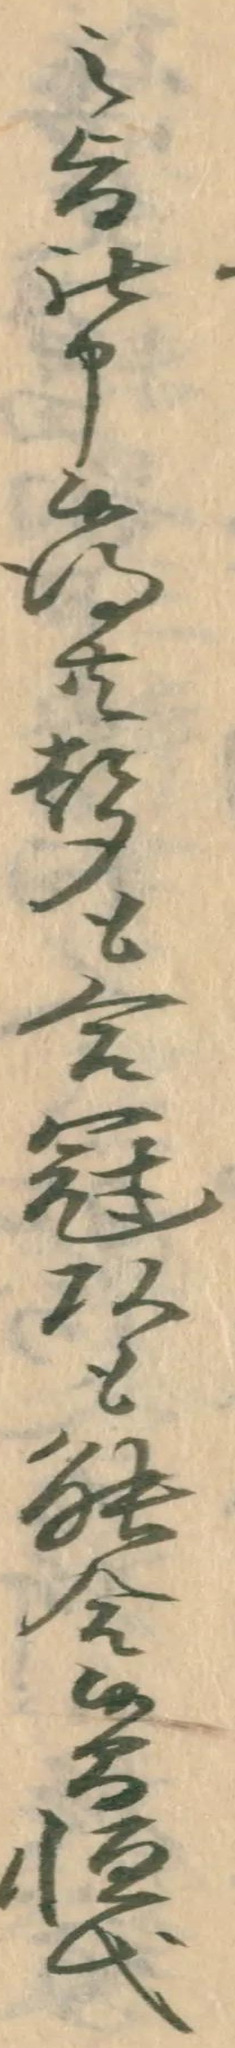之旨被申候得共声も合冠頭も能合候間恒氏
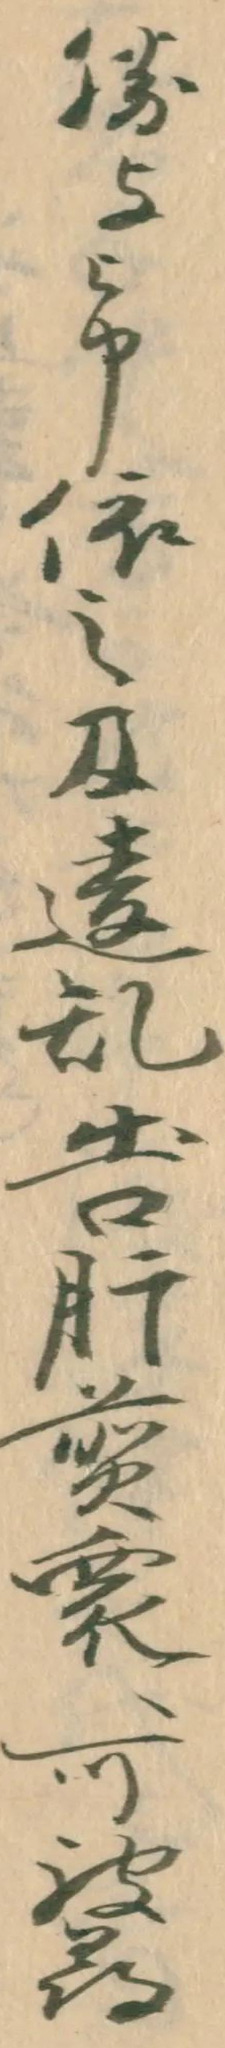勝と被申依之及違乱出口肝煎衆へ可被尋
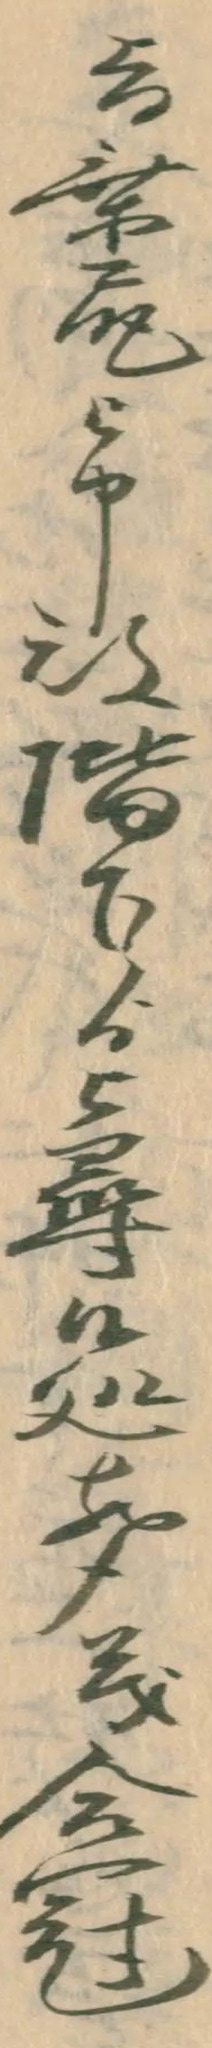旨乗尻被申故階下ゟ被尋候処声義合冠
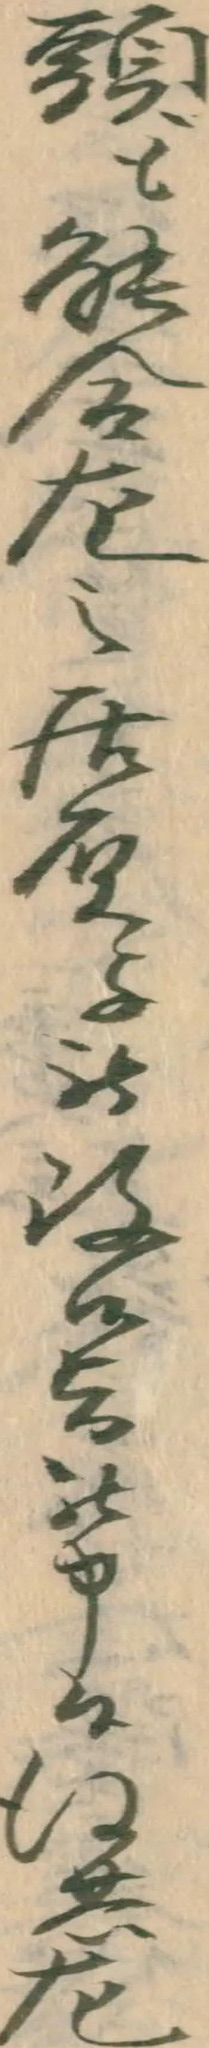頭も能合左之居負と被改候旨被申候得共左
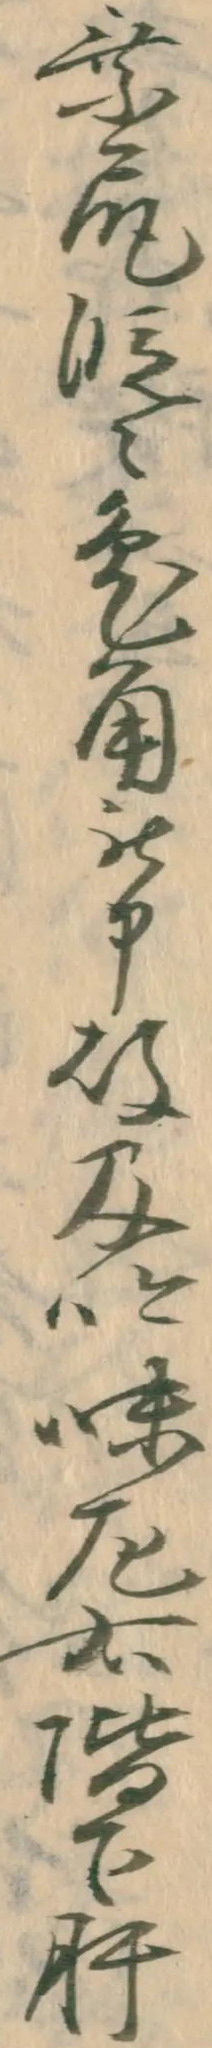乗尻段々兎角被申故及吟味左右階下肝
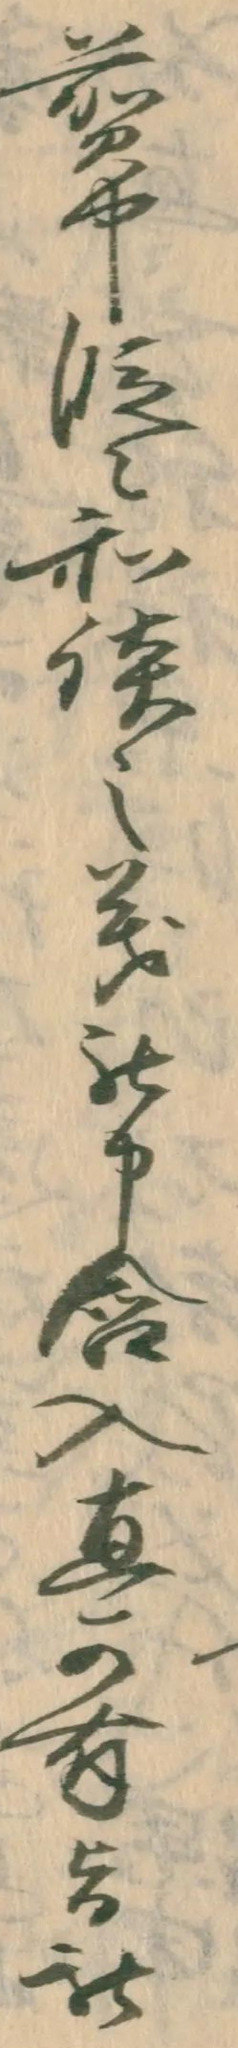煎中段々和談之義被申含入直可有旨被
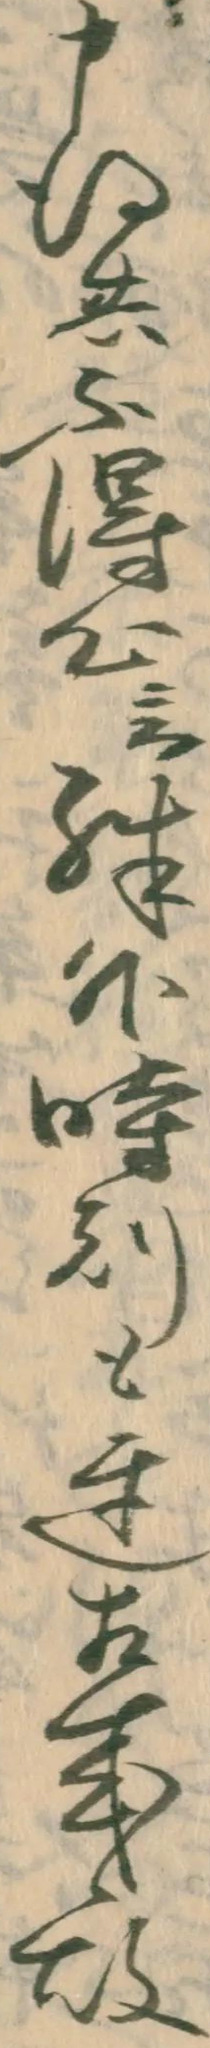申候得共不得心ニ而殊外時刻も遅相成候故
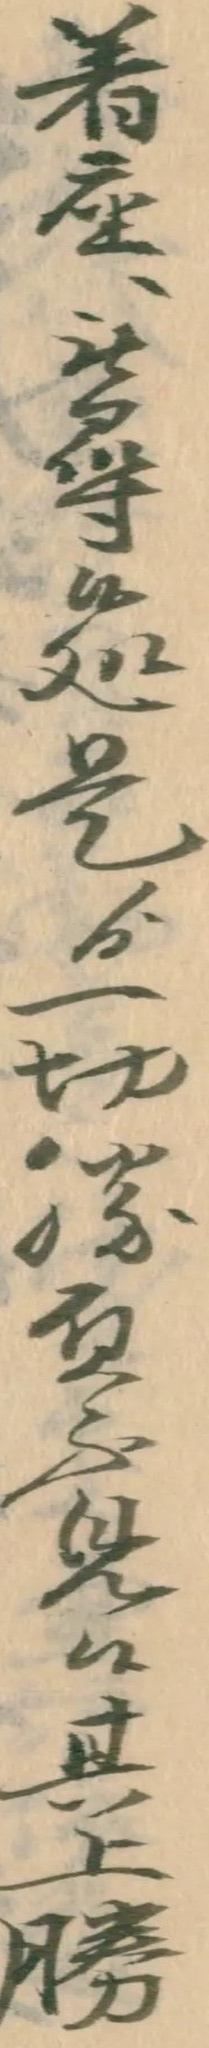着座へ被尋候処是ゟ一切勝負不見候其上勝
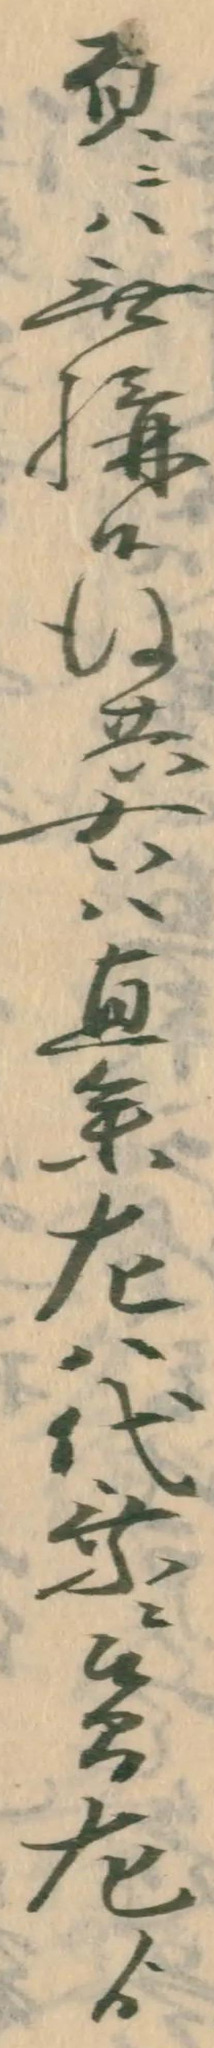負には無構候得共右ハ直参左は代乗ニ候間左ゟ
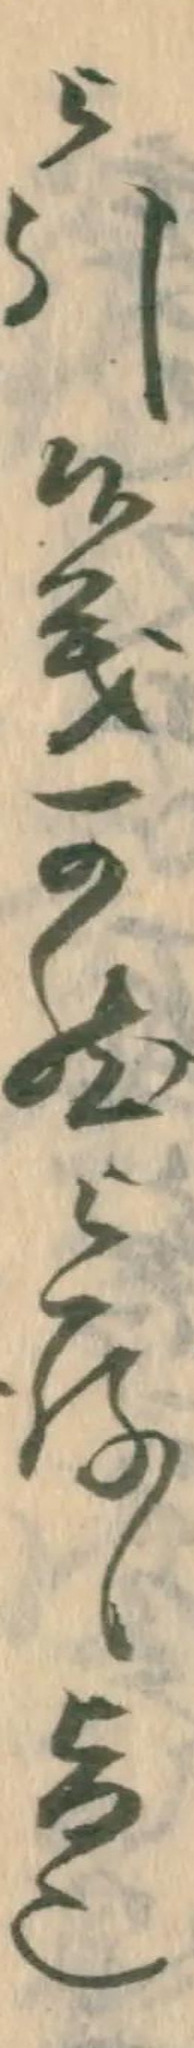被引候義可然被存候旨也
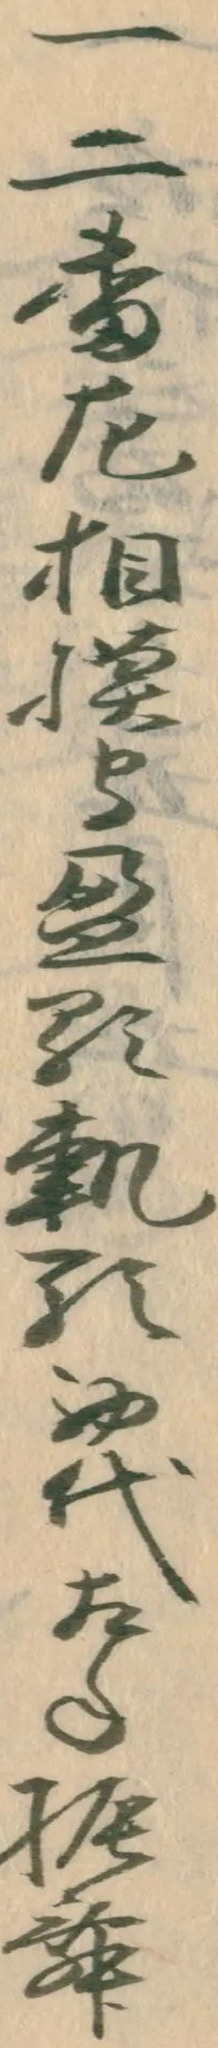一二番左相模守盈顕軌類初代相手振舞
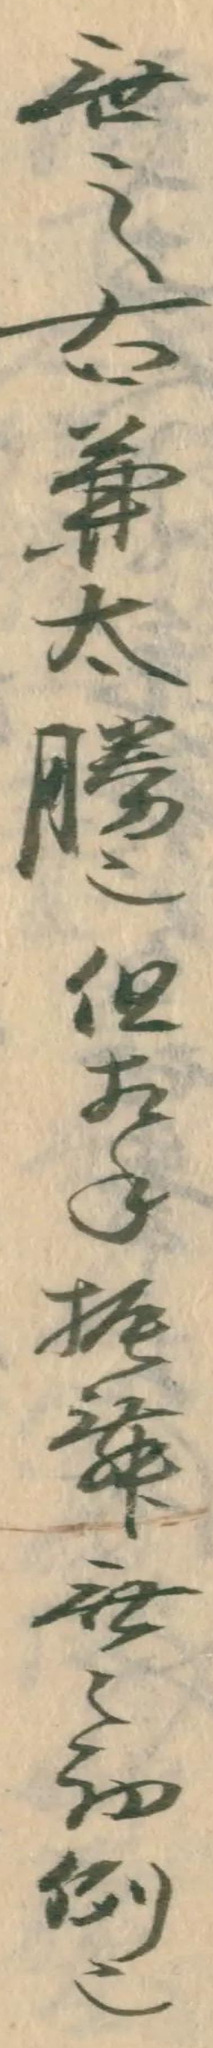無之右兼太勝也但相手振舞無之初例也
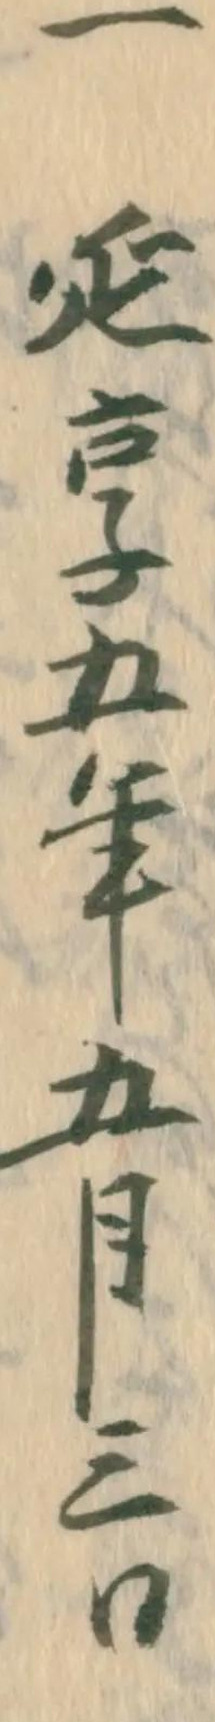一延享五年五月三日
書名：賀茂社記録. 第12冊
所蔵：国立国会図書館 National Diet Library, JAPAN
